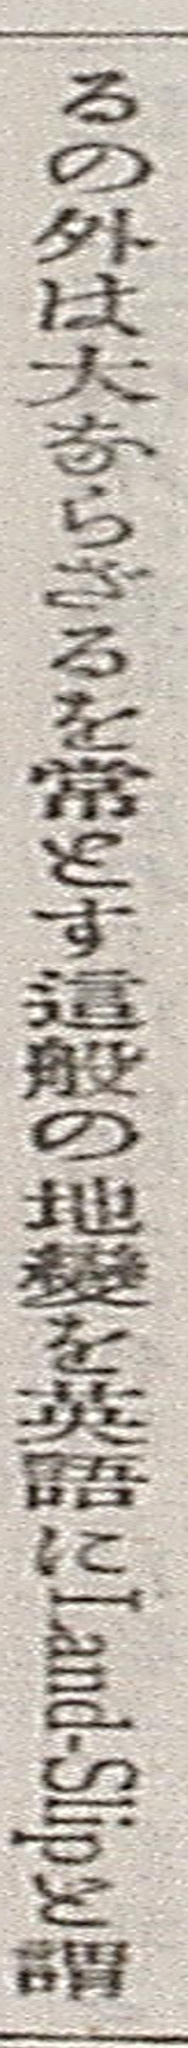るの外は大ならざるを常とす這般の地変を英語に-と謂
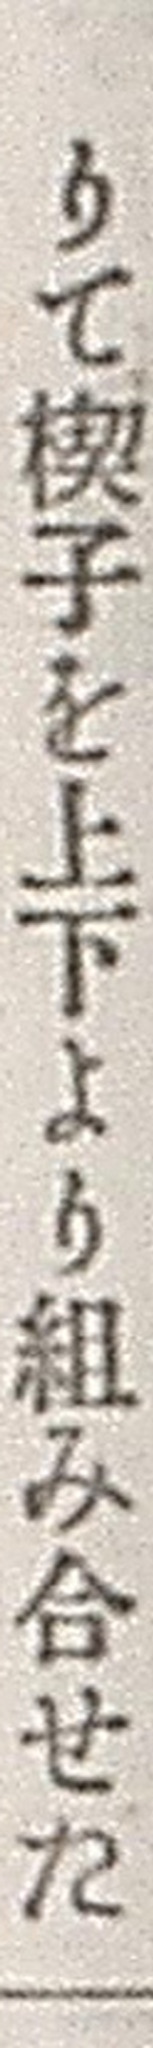りて楔子を上下より組み合せた
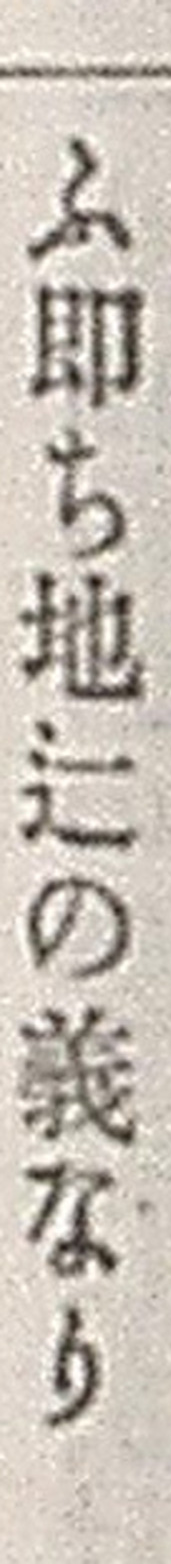ふ即ち地辷の義なり
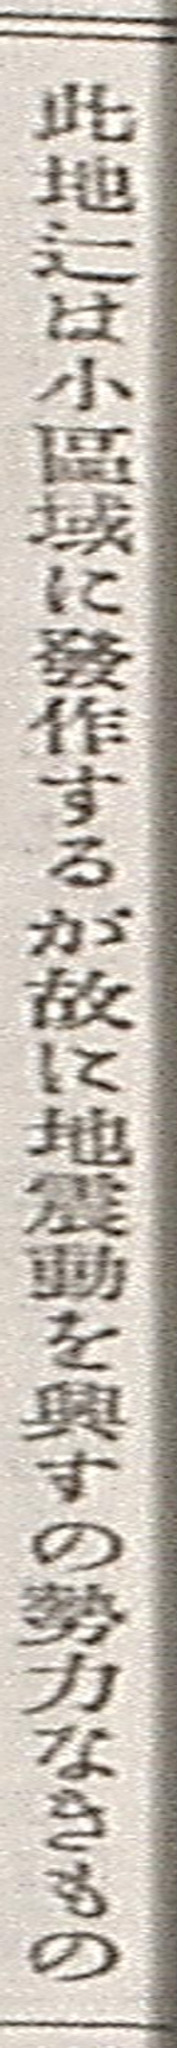此地辷は小区域に発作するが故に地震動を興すの勢力なきもの
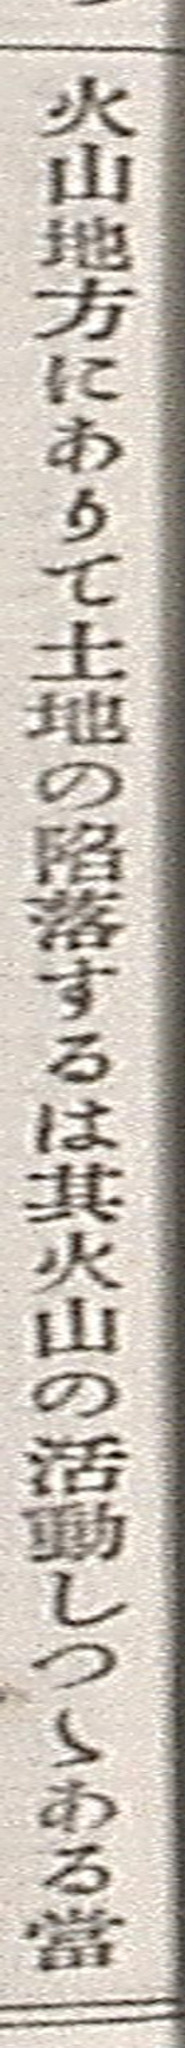火山地方にありて土地の陥落するは其火山の活動しつゝある当
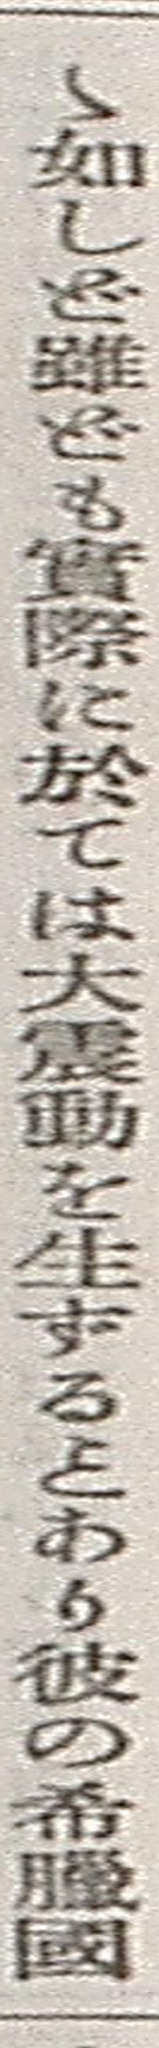ゝ如しど雖ども実際に於ては大震動を生ずることあり彼の希臘国
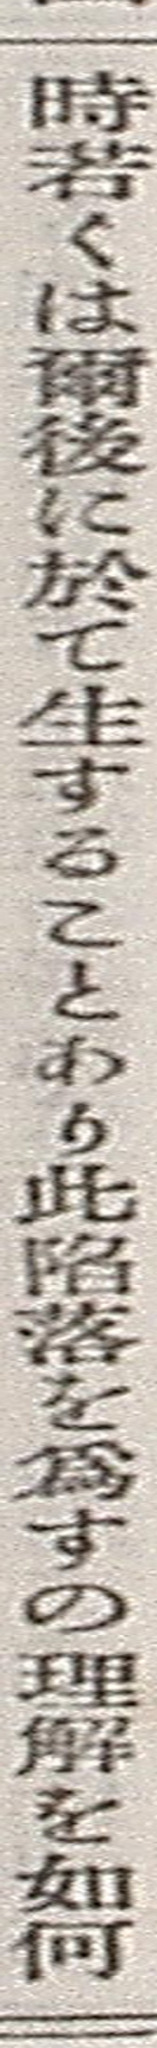時若くは爾後に於て生することあり此陥落を為すの理解を如何
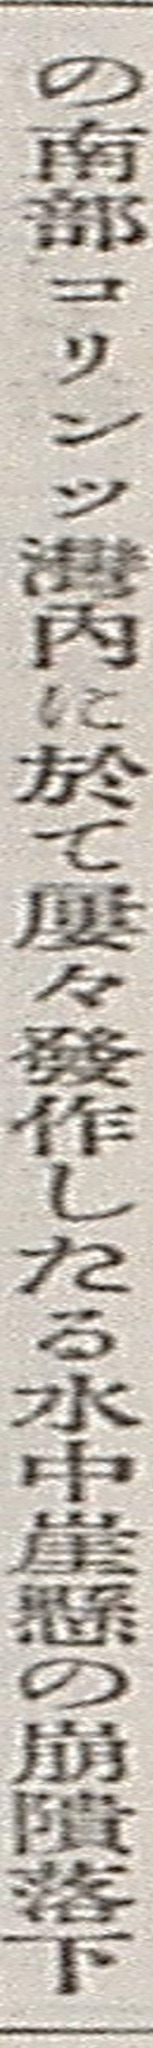の南部コリンツ湾内に於て屡々発作したる水中崖懸の崩潰落下
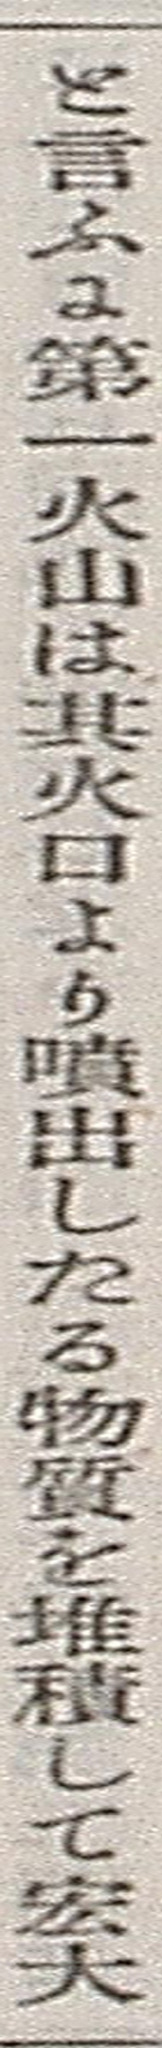と言ふに第一火山は其火口より噴出したる物質を堆積して宏大
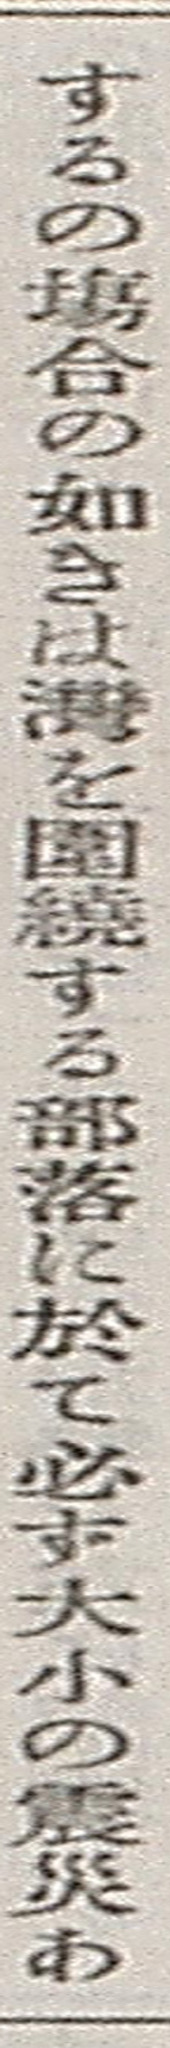するの場合の如きは湾を囲繞する部落に於て必ず大小の震災あ
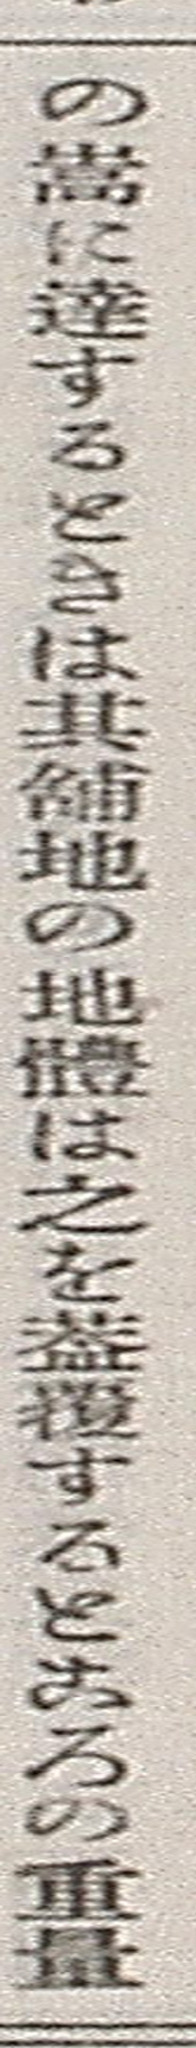の嵩に達するときは其舗地の地体は之を蓋覆するところの重量
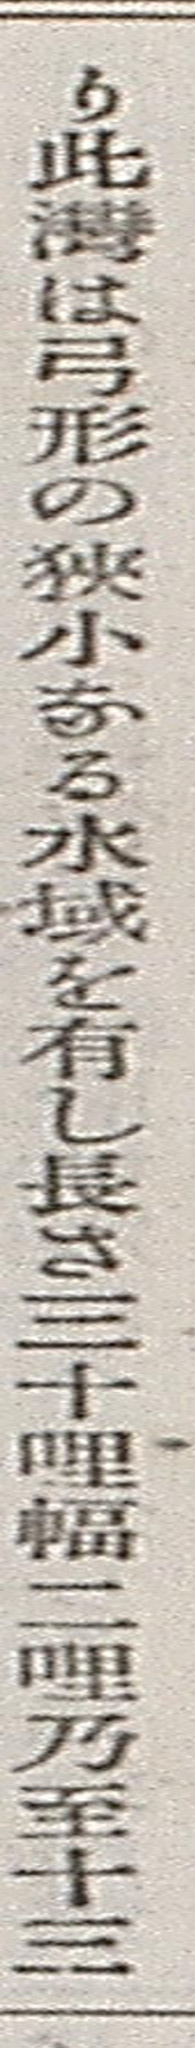り此湾は弓形の狭小なる水域を有し長さ三十哩幅二哩乃至十三
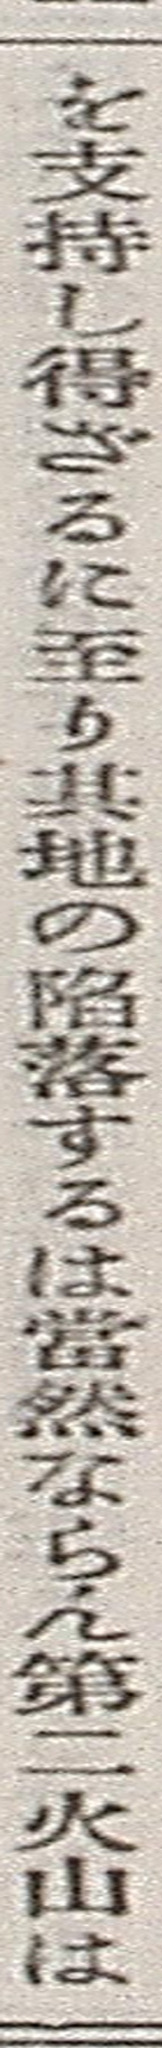を支持し得ざるに至り其地の陥落するは当然ならん第二火山は
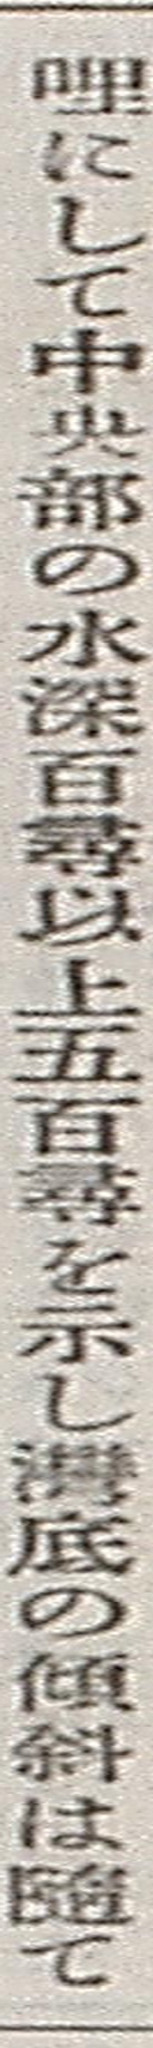哩にして中央部の水深百尋以上五百尋を示し湾底の傾斜は随て
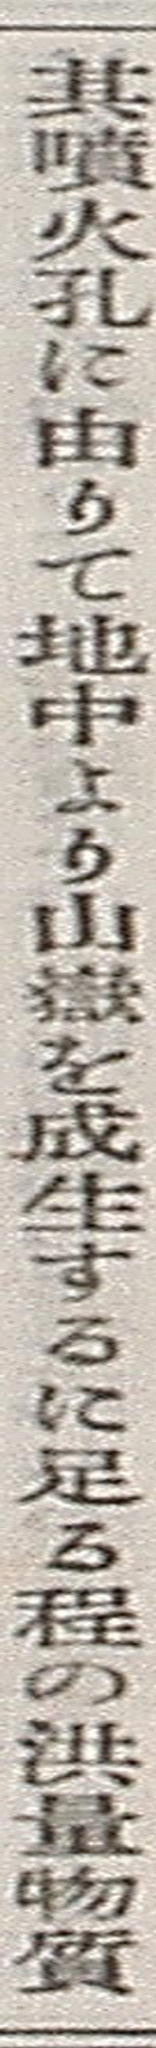其噴火孔に由りて地中より山嶽を成生するに足る程の洪量物質
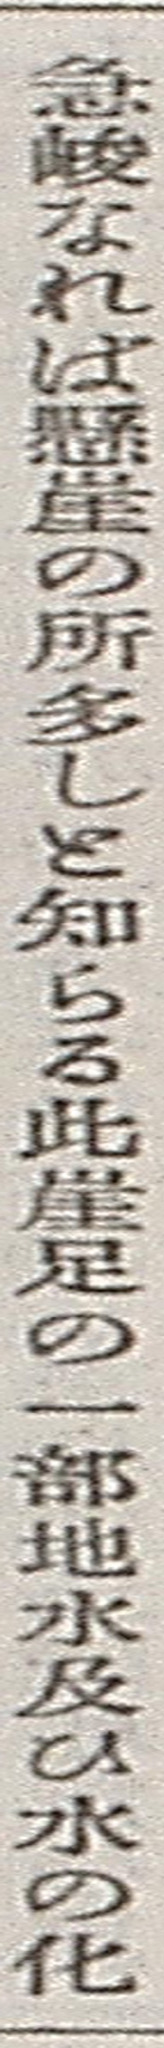急峻なれば懸崖の所多しと知らる此崖足の一部地水及ひ水の化
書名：風俗畫報臨時増刊第百二十號　大海嘯被害録（下）
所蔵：東京大学地震研究所図書室 Earthquake Research Institute Library, The University of Tokyo, JAPAN
